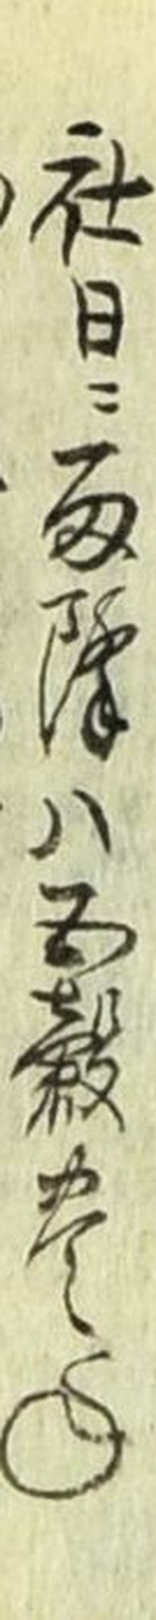社日ニ雨降ハ五穀豊年
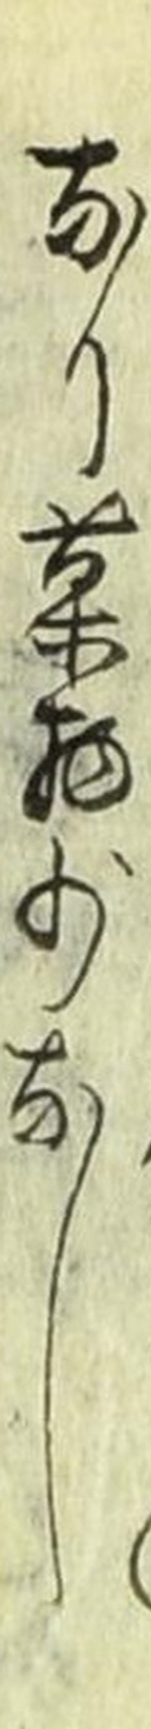なり菓物少なし

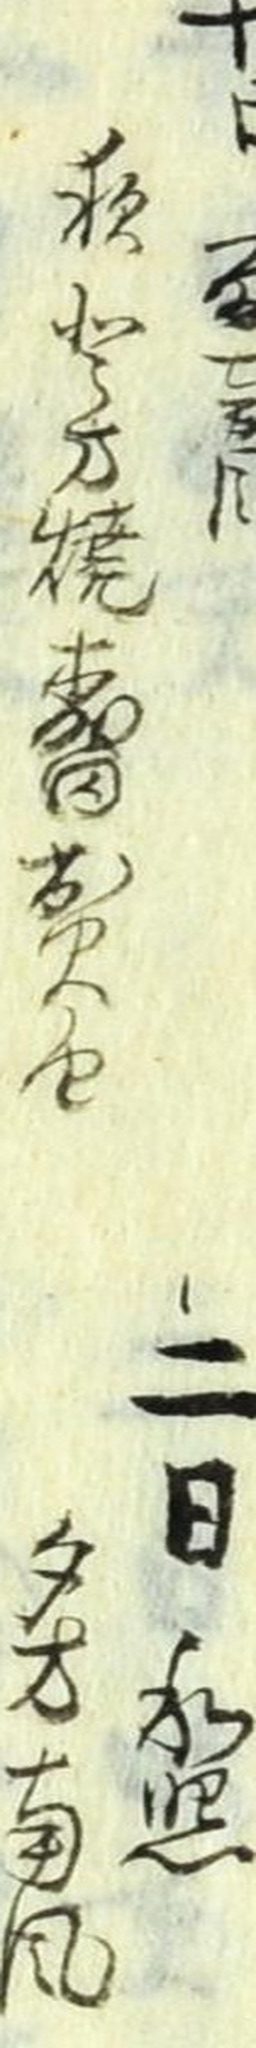夜北之方焼森田出火之由夕方南風
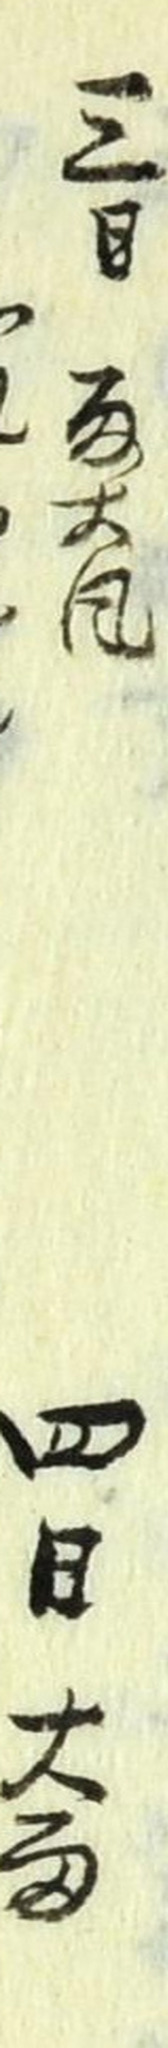三日雨大風四日大雨
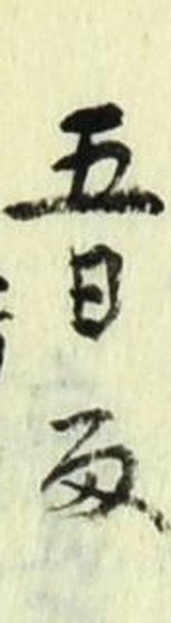五日雨
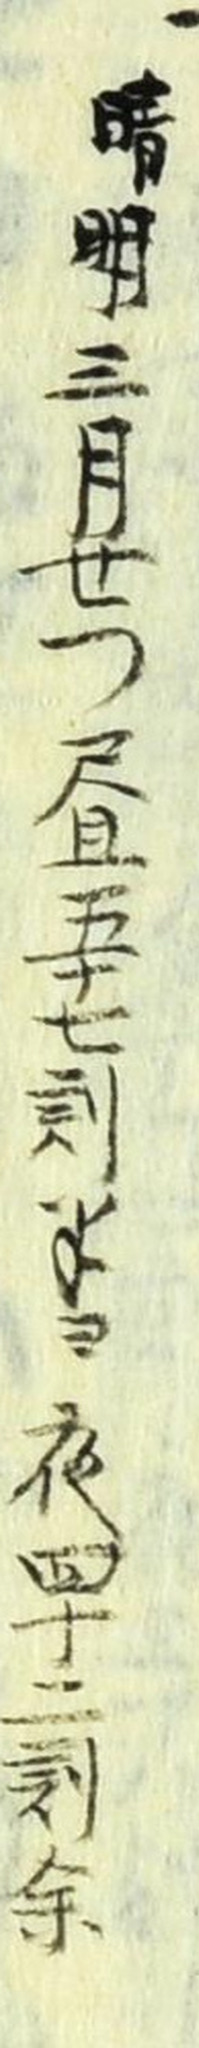晴明三月せつ昼五十七刻半ヨ夜四十二刻余
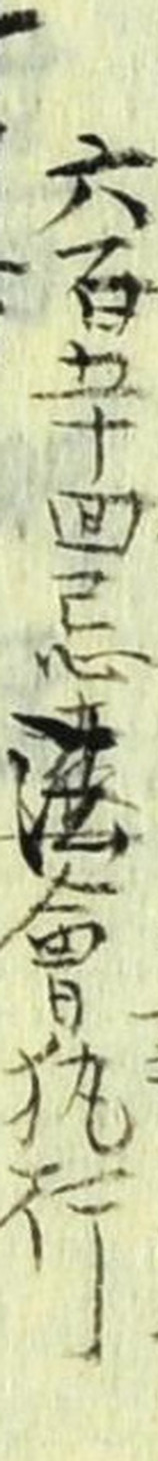六百五十回忌法会執行
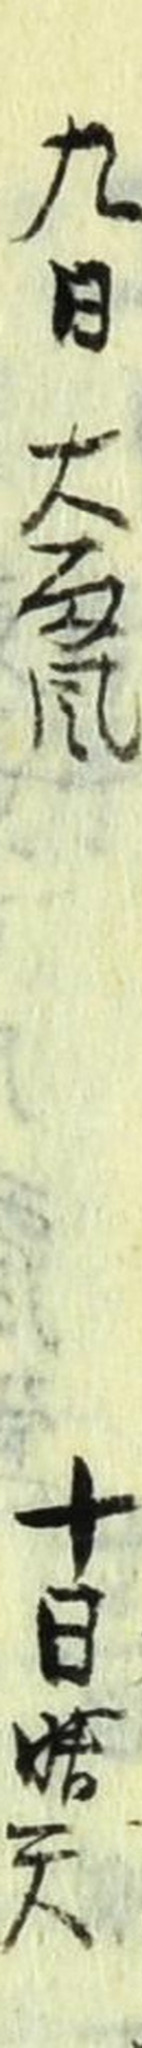九日大雨風十日晴天
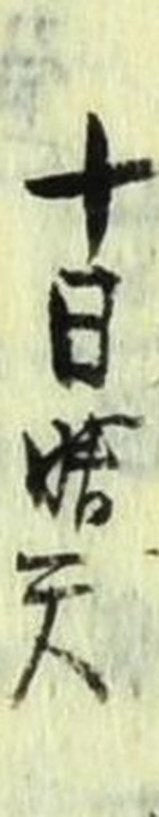廿日晴天
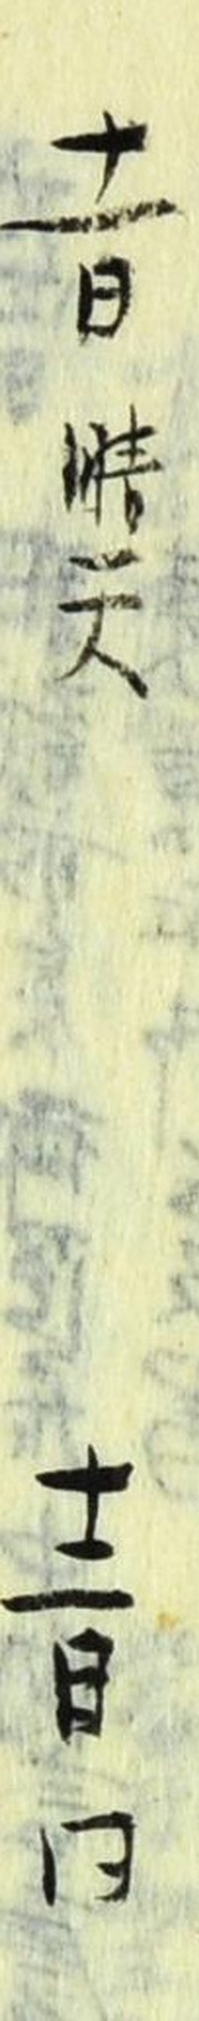十一日晴天十一日同
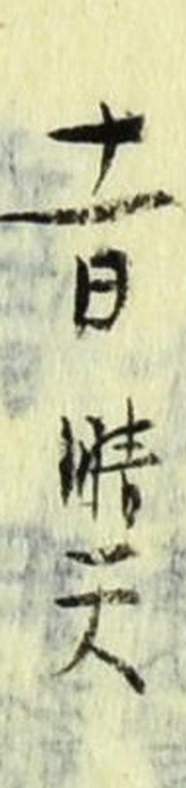十九日雨天
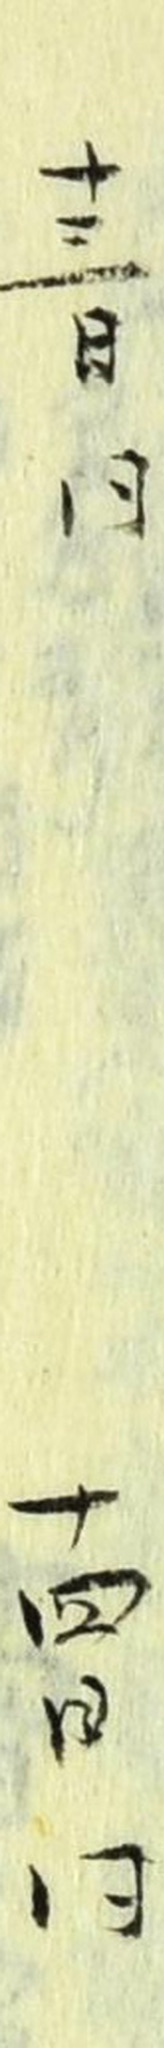十三日同十四日同
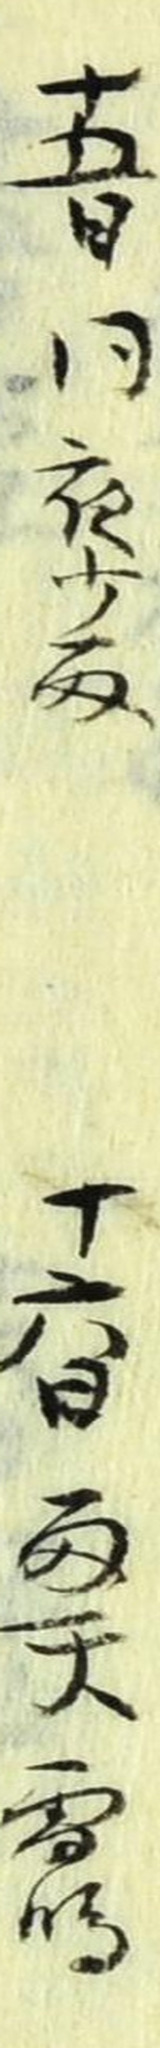十五日同夜少雨十六日雨天雷鳴
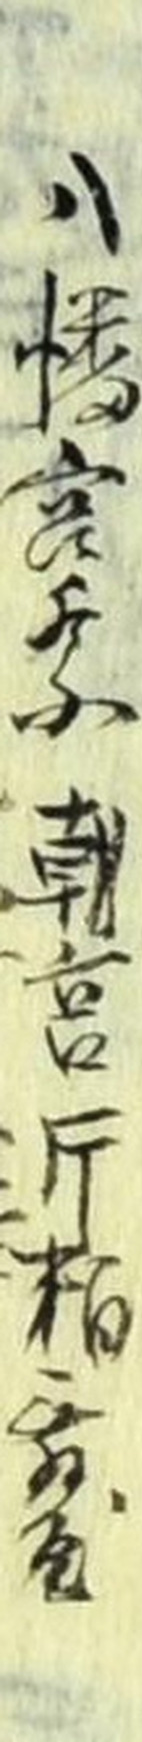八幡宮祭朝宮片粕舞屋
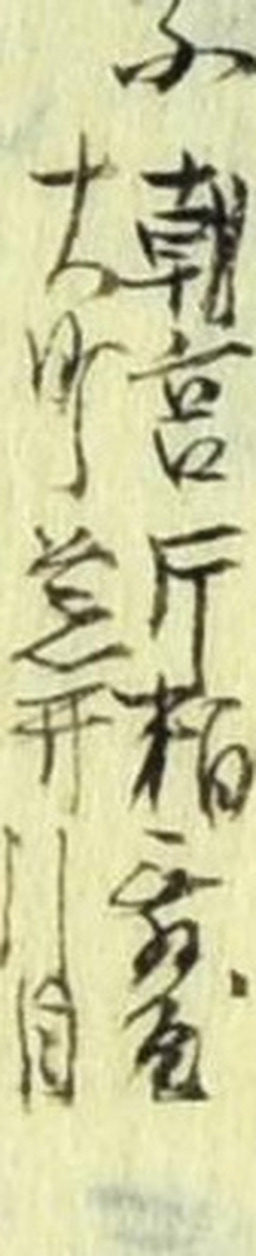大町荒井引目
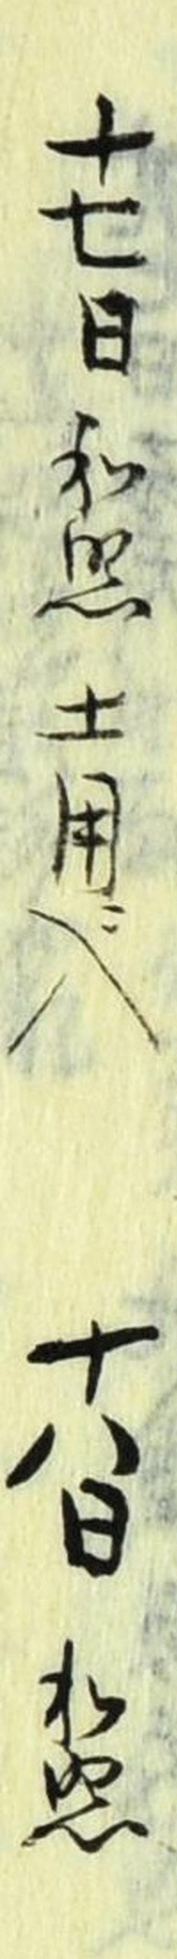十七日和照土用ニ入十八日和照
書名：（日記）
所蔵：福井県文書館 Fukui Prefectural Archives
